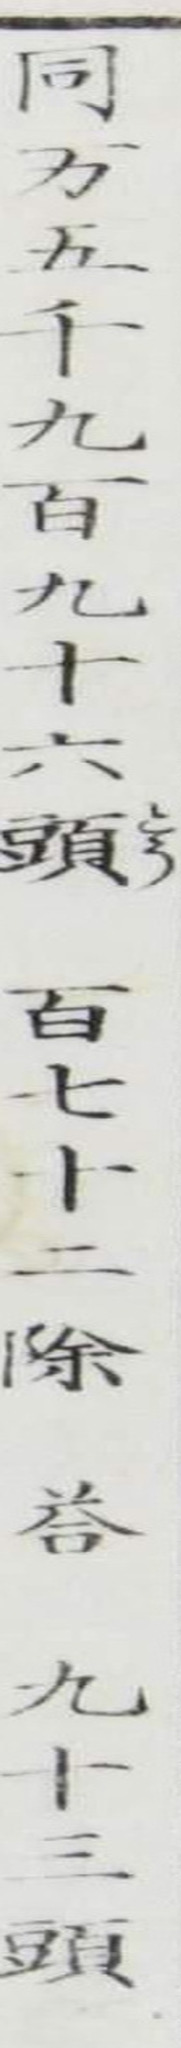同万五千九百九十六頭百七十二除答九十三頭
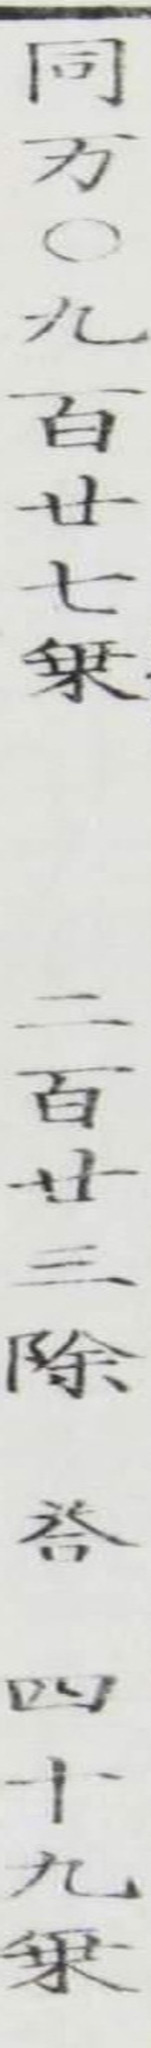同万〇九百廿七乗二百廿三除答四十九頭
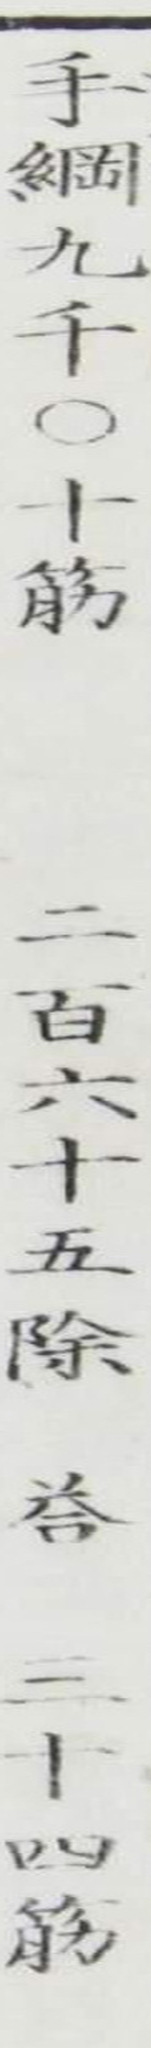手綱九千〇十筋二百六十五除答二十四筋
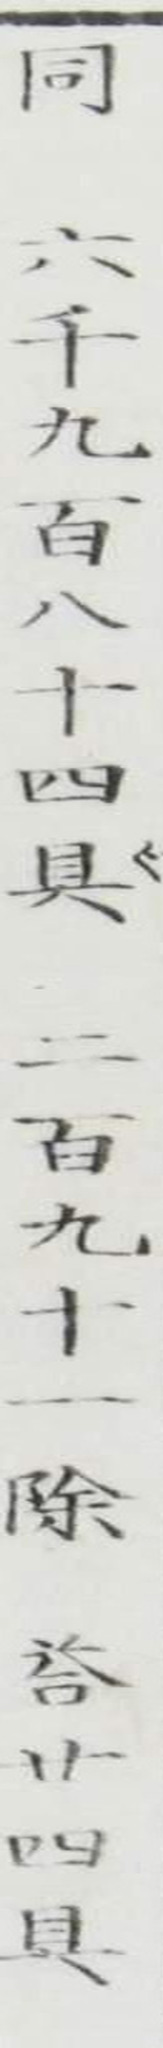同六千九百八十四具二百九十一除答廿四具
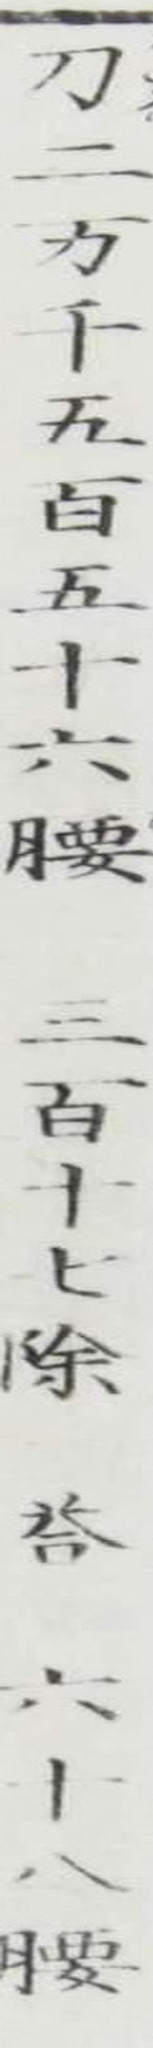刀二万千五百五十六腰二百十七除答六十八腰
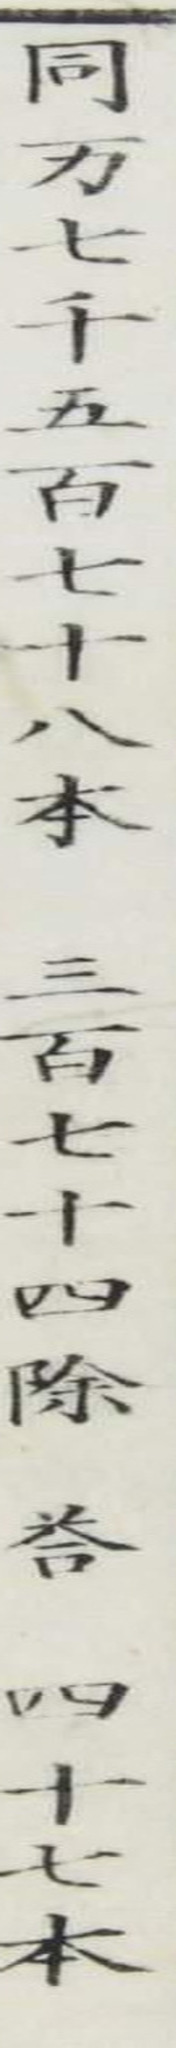同万七千五百七十八本三百七十四本除答四十七本
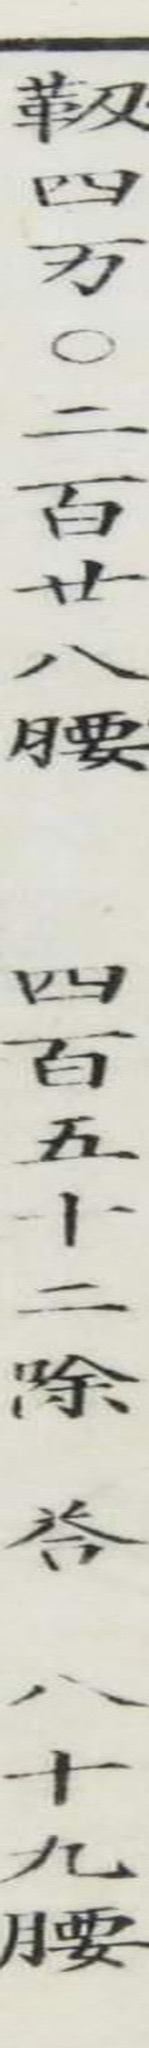靭四万〇二百二十八腰四百五十二除答八十九腰
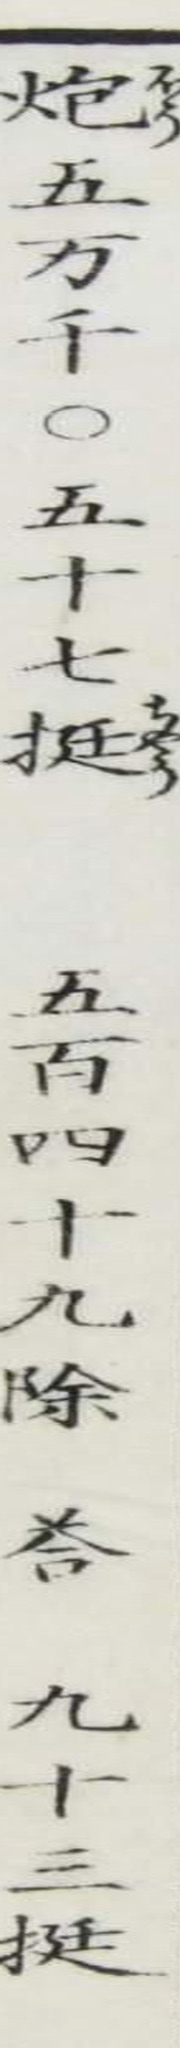炮五万千〇五十七挺五百四十九除答九十三挺
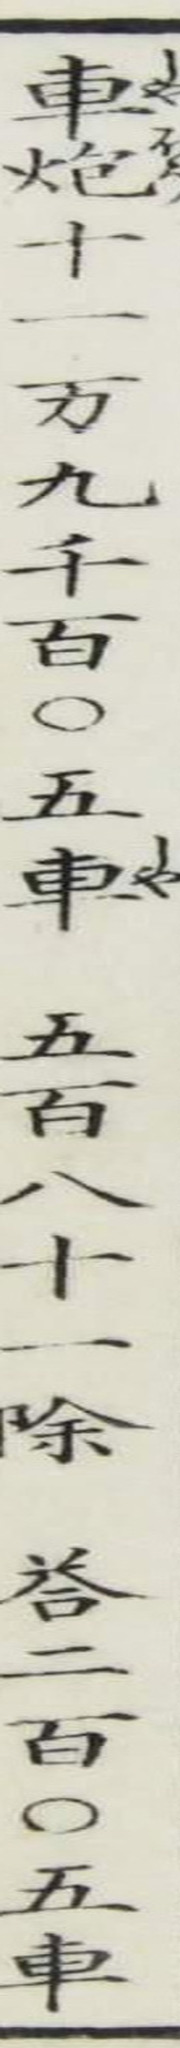車炮十一万九千百〇五車五百八十一除答二百〇五車
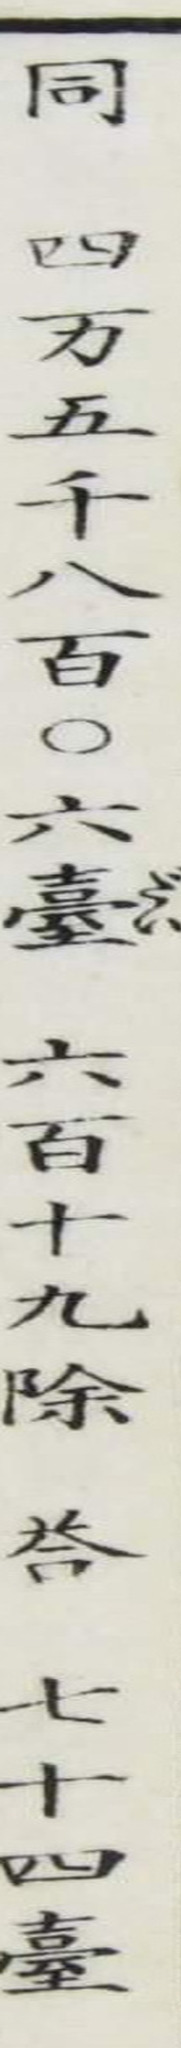同四万五千八百〇六台六百十九除答七十四台
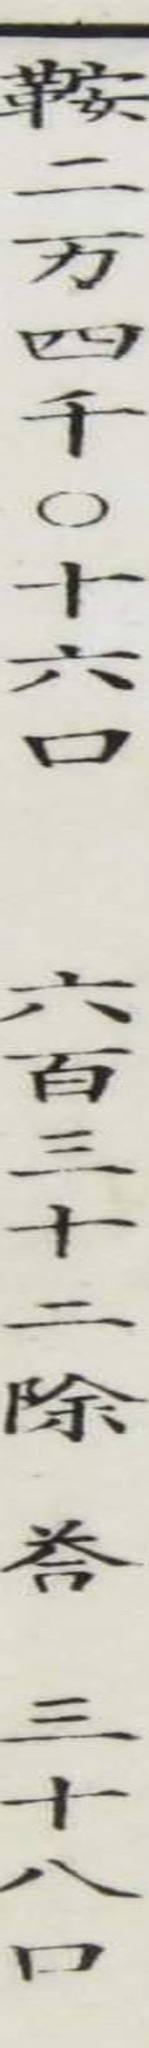鞍二万四千〇十六口六百三十二除答三十八口
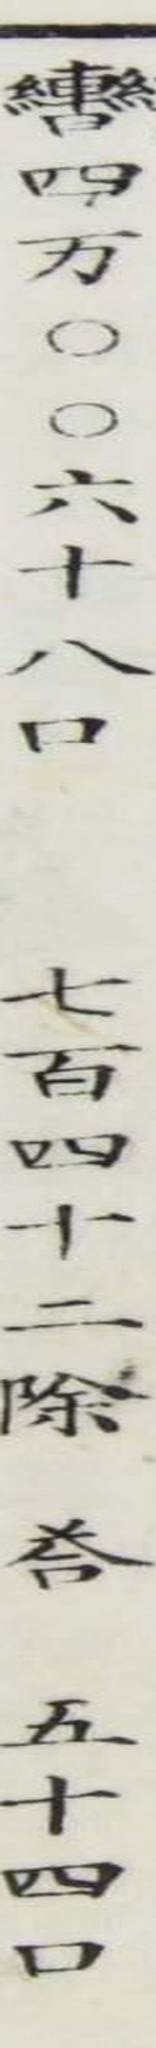轡四万〇〇六十八口七百四十二除答五十四口
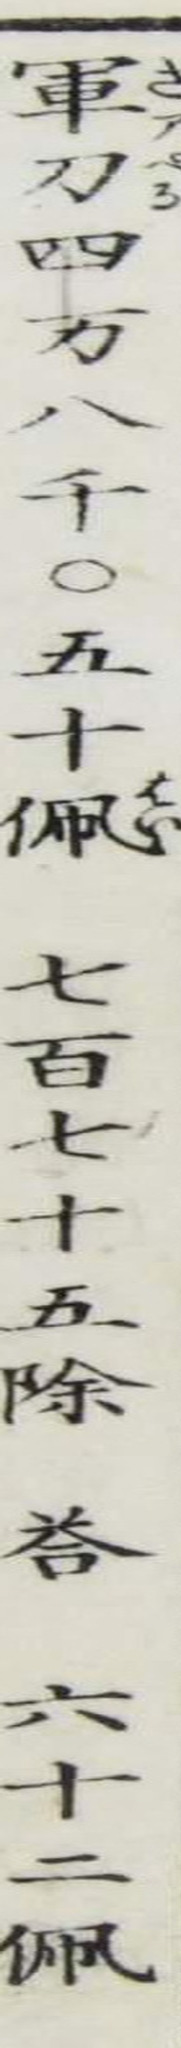軍刀四万八千〇五十佩七百七十五除答六十二佩
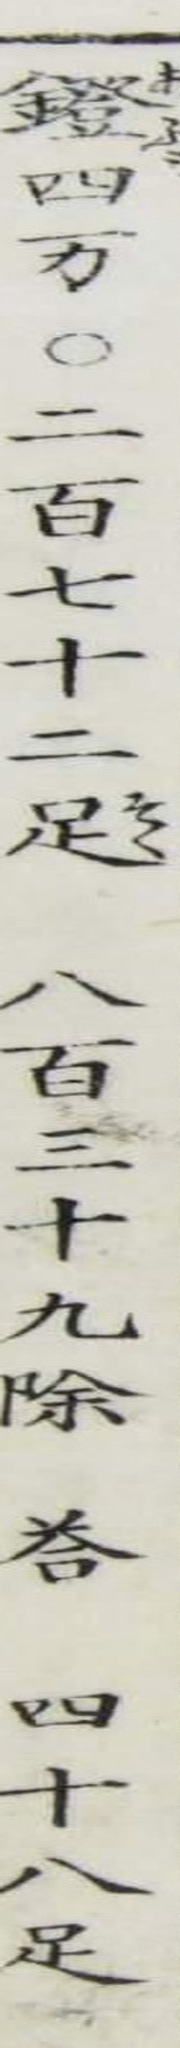鎧四万〇二百七十二足八百三十九除答四十八足
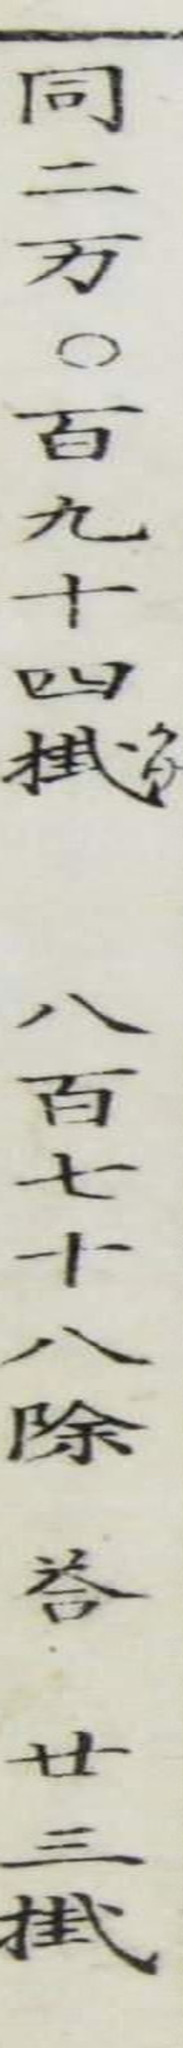同二万〇百九十四掛八百七十八除答廿三掛
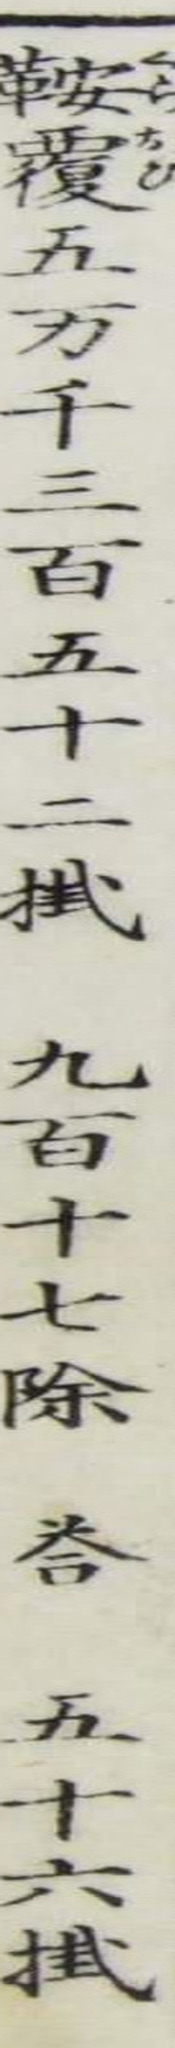鞍覆五万千三百五十二掛九百十七除答五十六掛
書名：明治小學塵劫記 卷1
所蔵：東京学芸大学教育コンテンツアーカイブ
